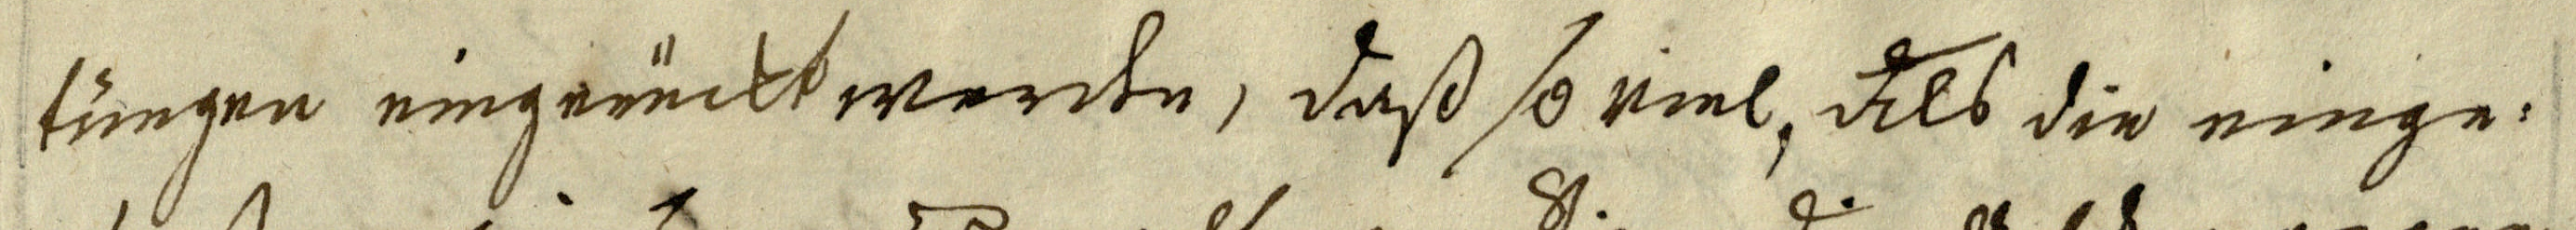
tungen eingerückt werden, daß so viel, als die einge¬
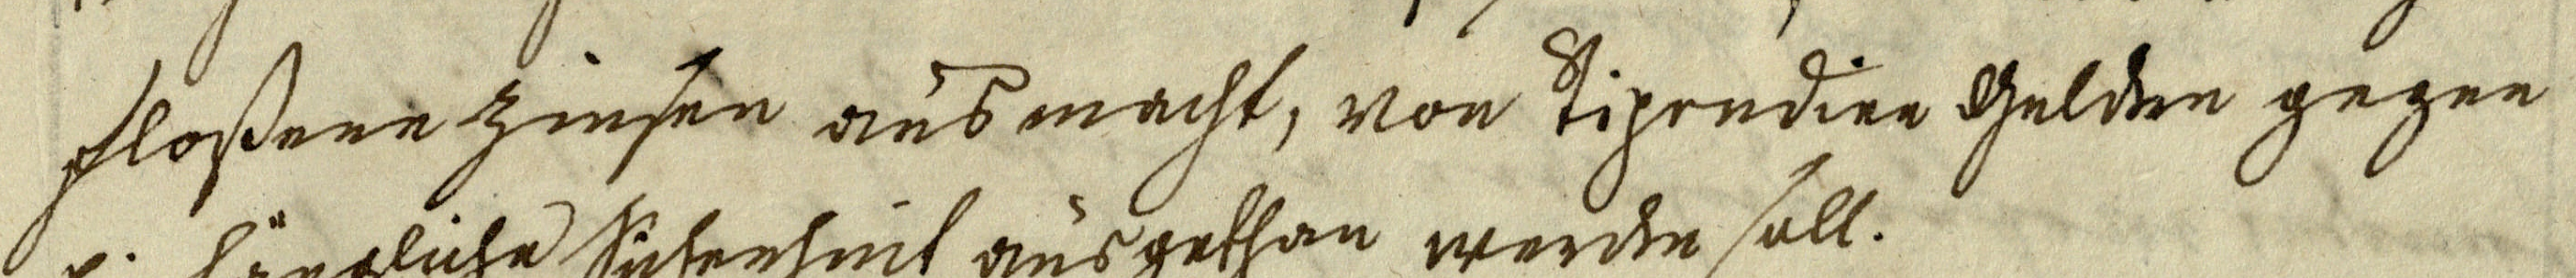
floßene Zinsen ausmacht, von Stipendien Geldern gegen
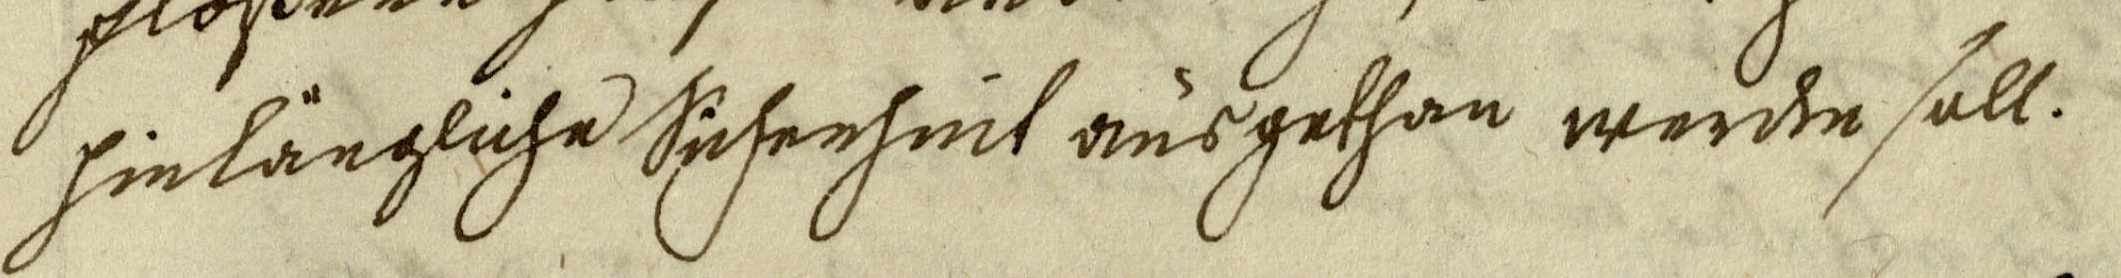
hinlängliche Sicherheit ausgethan werden soll.
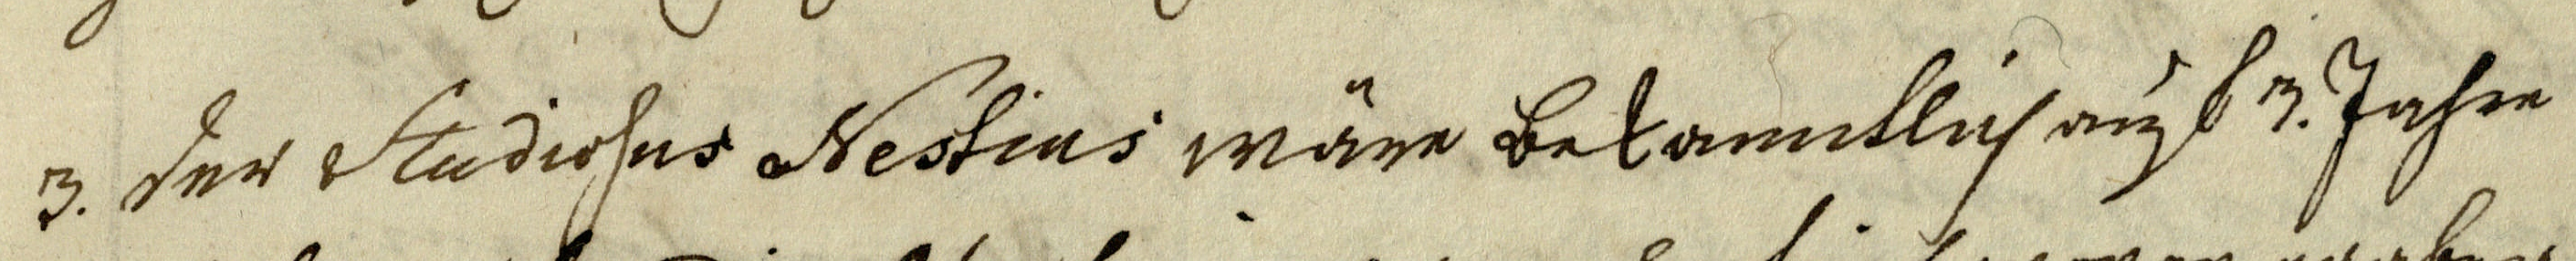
3. Der Studiosus Nestius wäre bekanntlich auf 3. Jahre
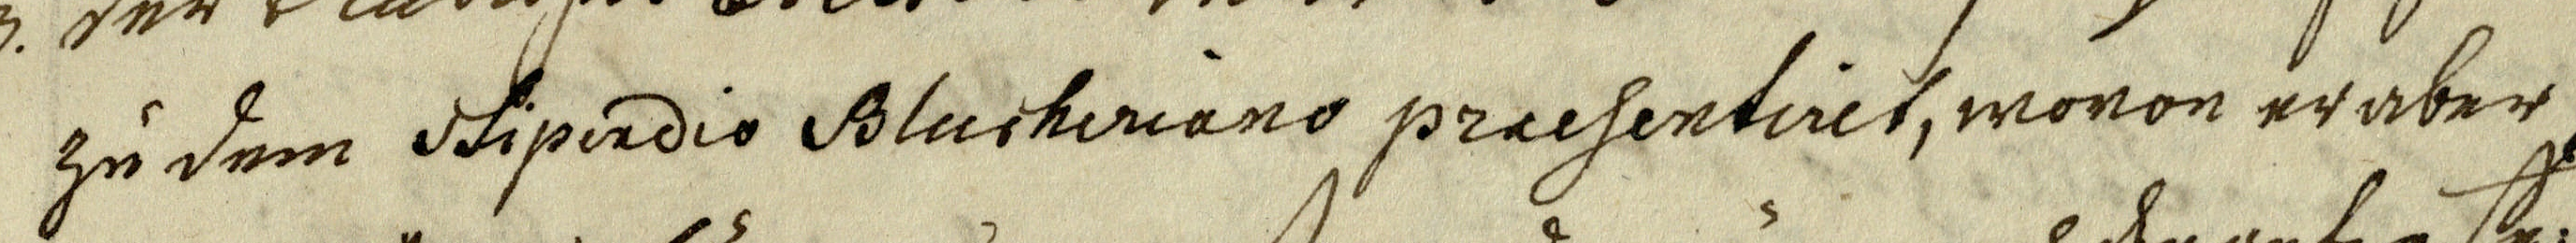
zu dem stipendio Blucheriano praesentiret, wovon er aber
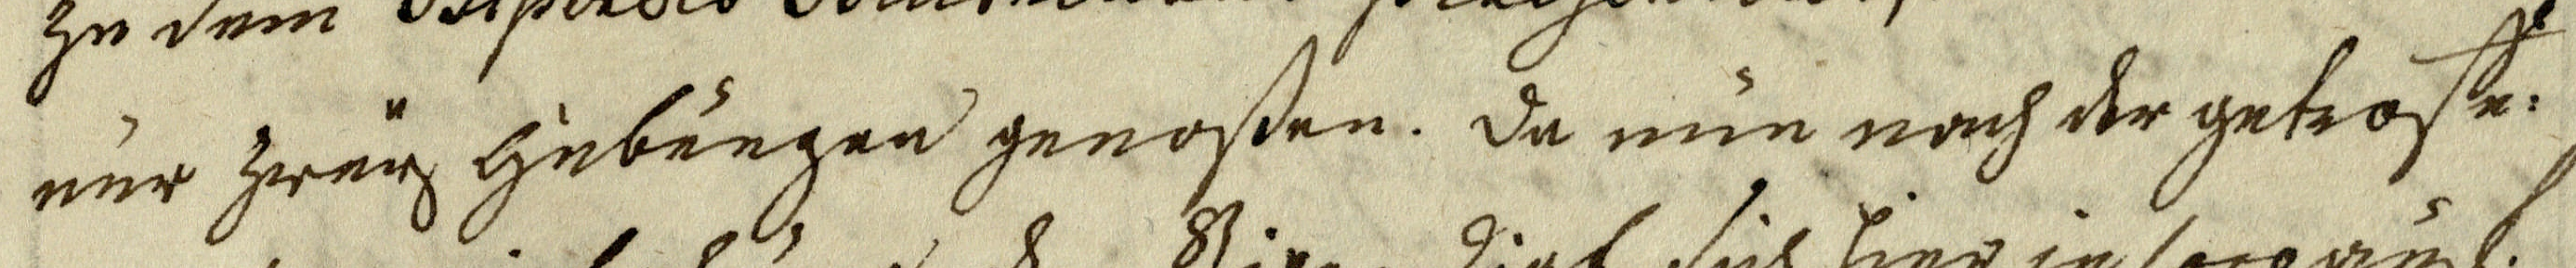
nur zweÿ Hebungen genoßen. Da nun nach der getroffe¬
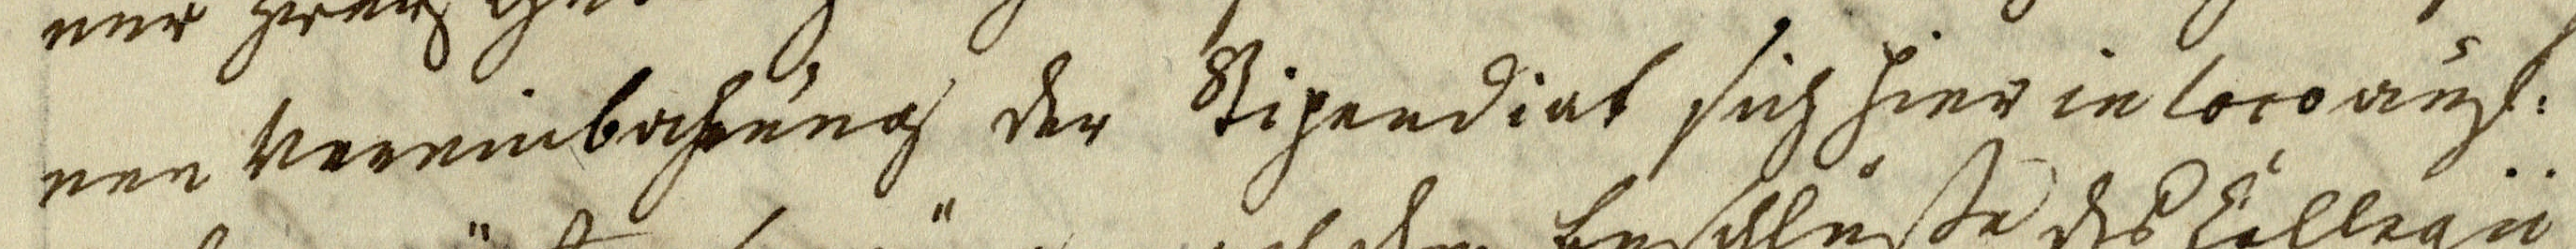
nen Vereinbahrung der Stipendiat sich hier in loco auf¬
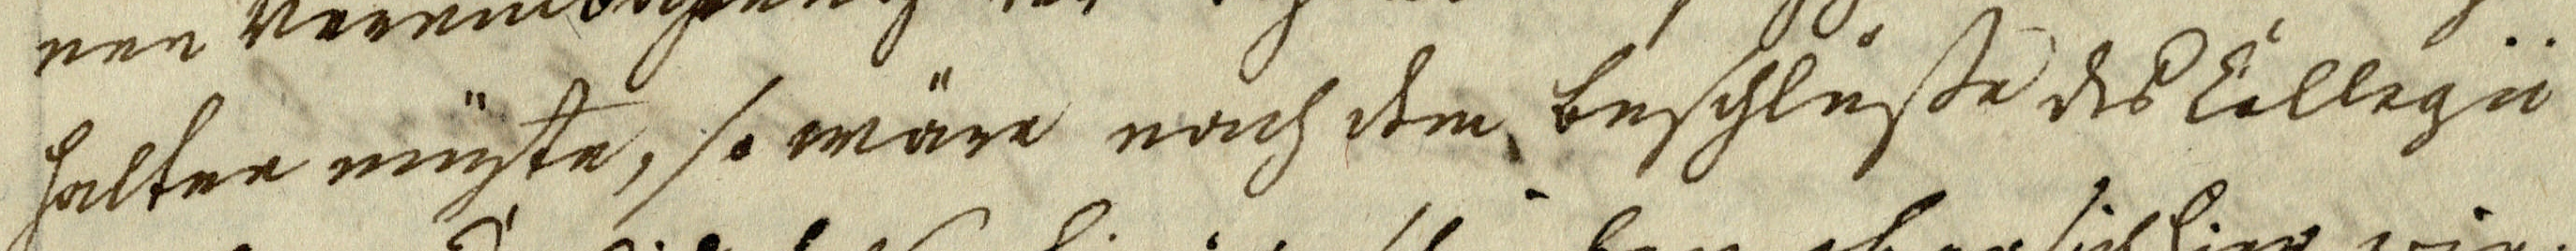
halten müste, so wäre nach dem Beschluße des Collegii
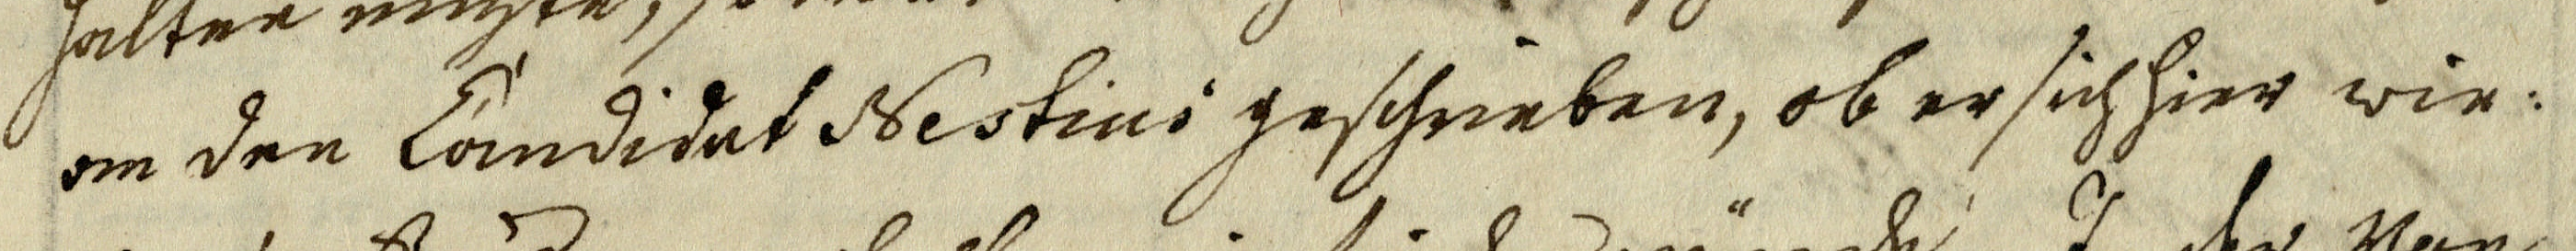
an den Candidat Nestius geschrieben, ob er sich hier wie¬
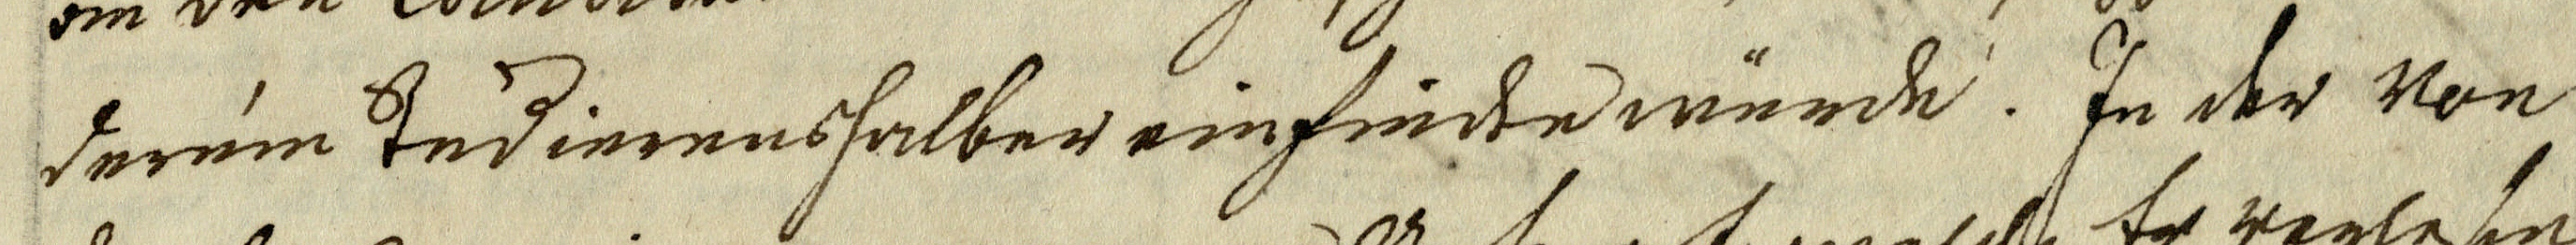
derum Studierenshalber einfinden würde. In der von
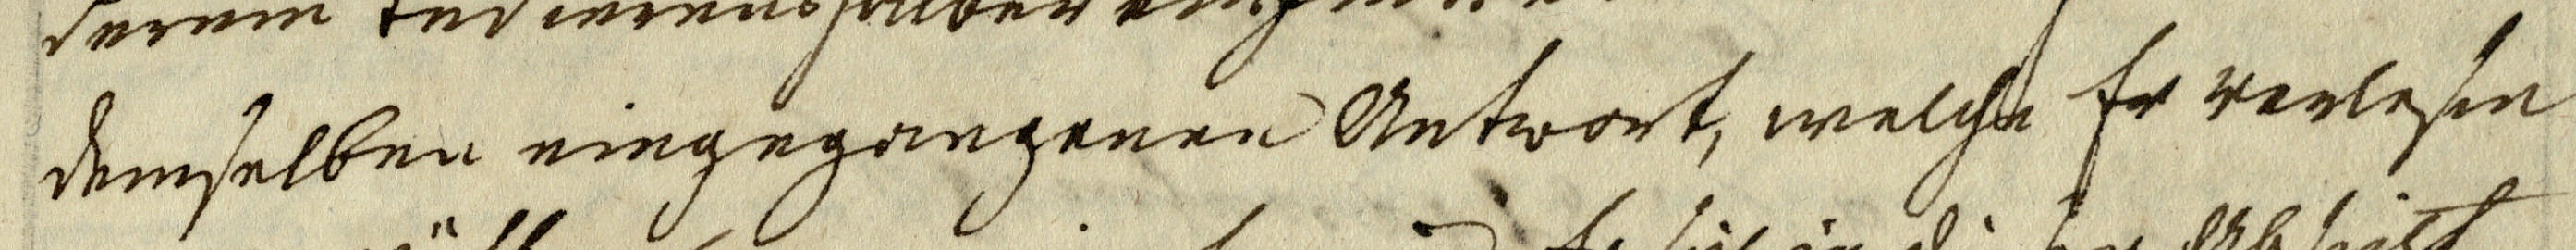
demselben eingegangenen Antwort, welche Er verlesen
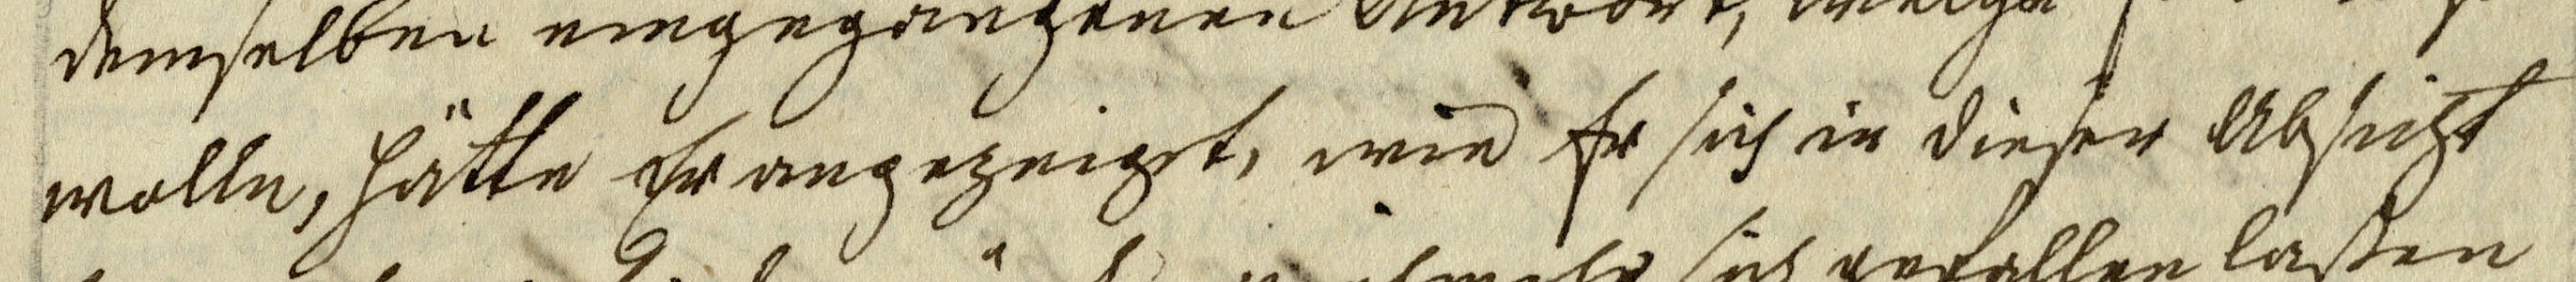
wolle, hätte Er angezeiget, wie Er sich in dieser Absicht
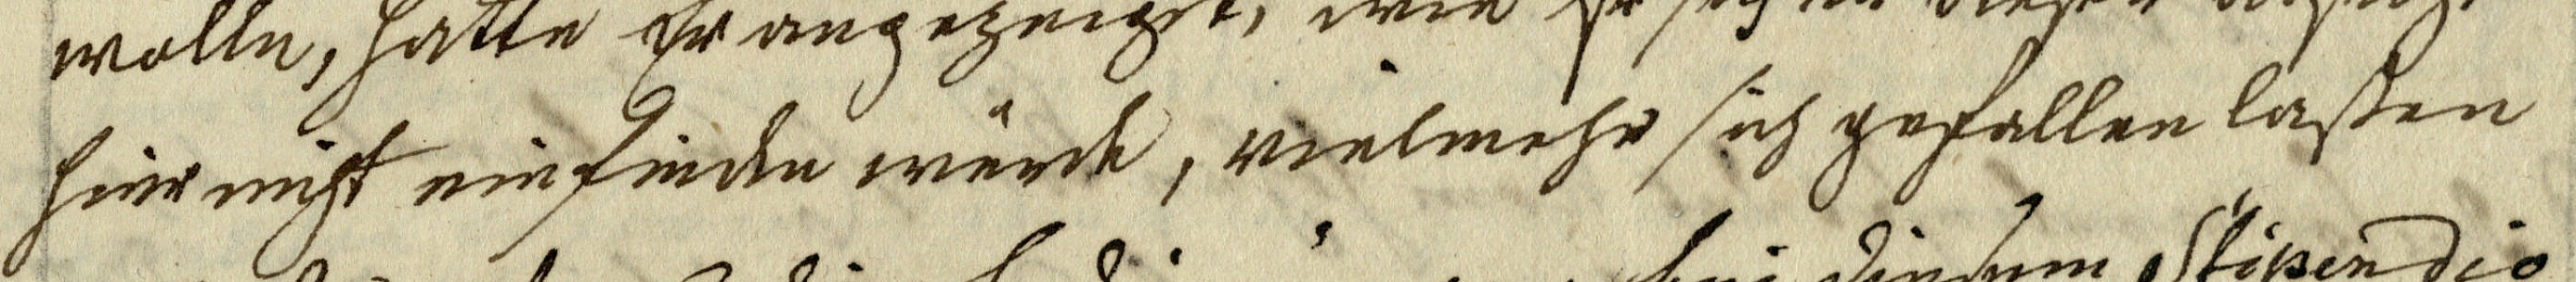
hier nicht einfinden würde, vielmehr sich gefallen laßen
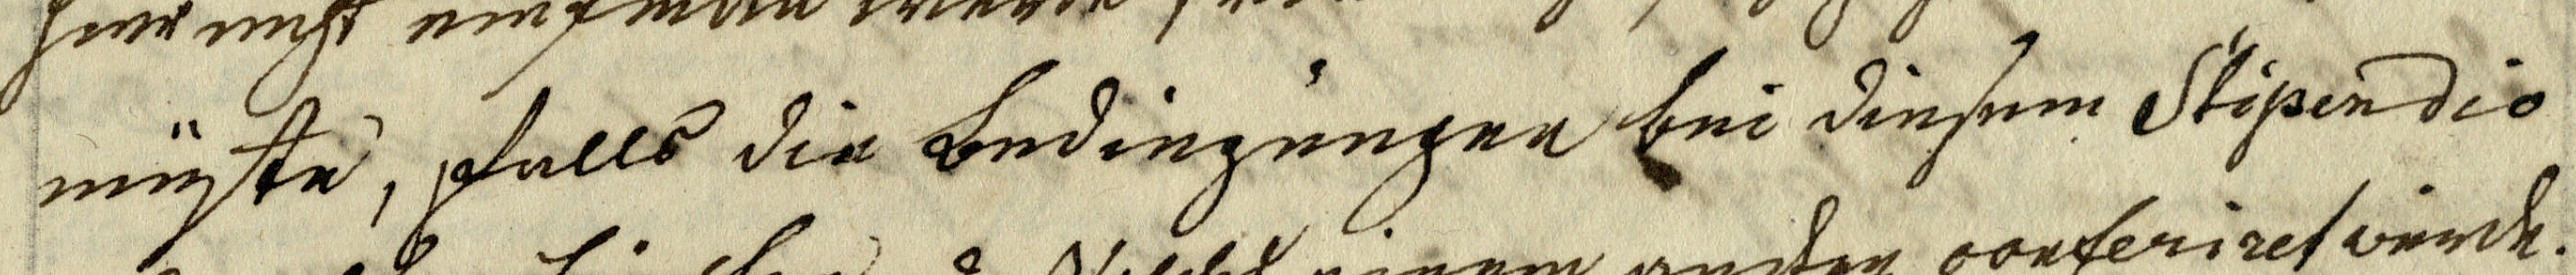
müste, falls die Bedingungen bei diesem Stipendio
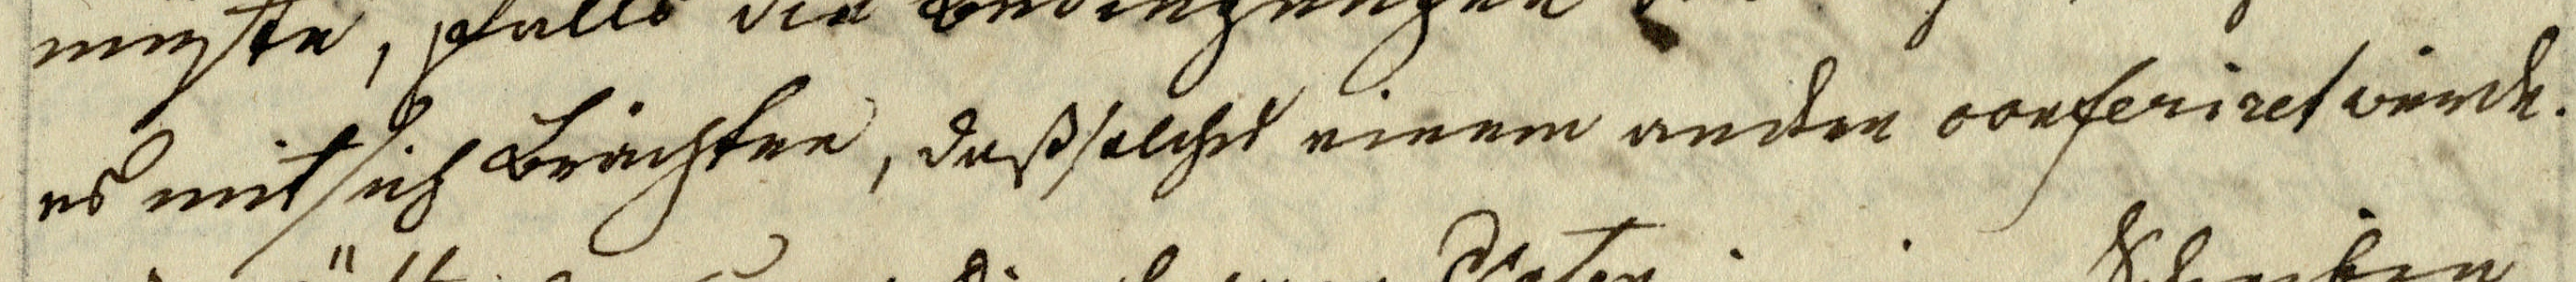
es mit sich brächten, daß solches einem andern conferiret würde.
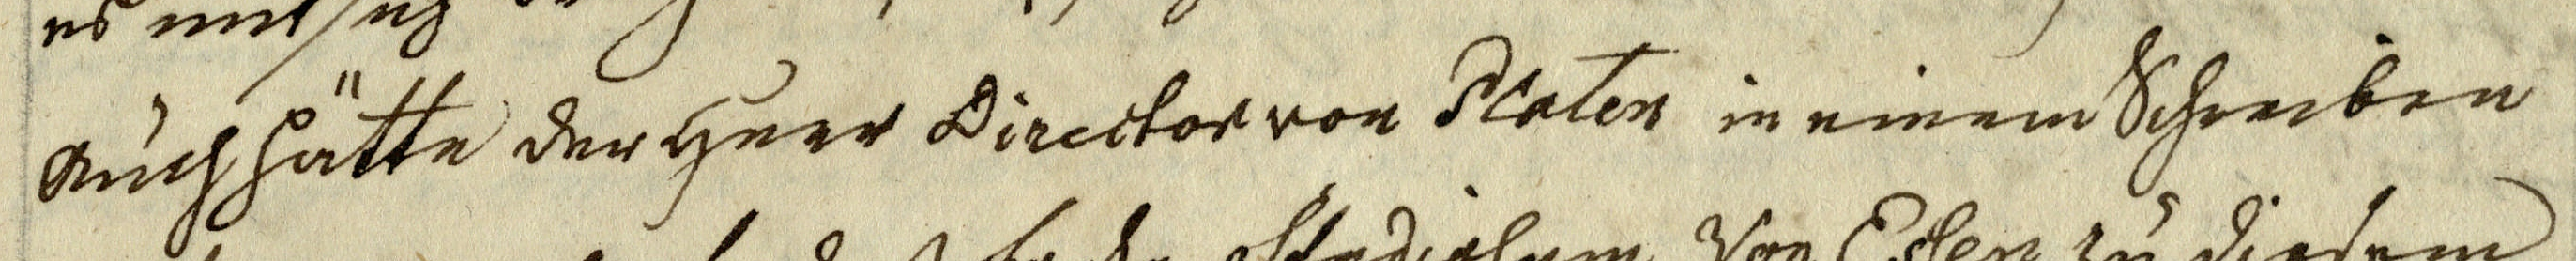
Auch hätte der Herr Director von Platen in einem Schreiben
